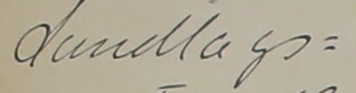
Landtags-
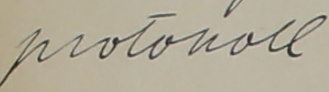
protokoll
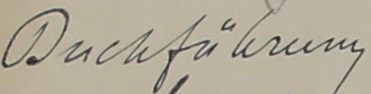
Buchführung
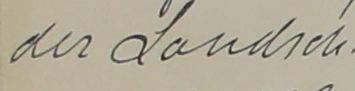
der Landsch
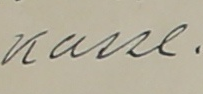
kasse
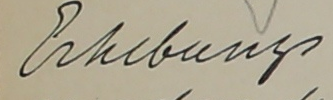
Erhebung
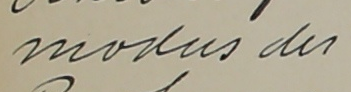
modus der
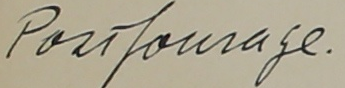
Postfourage
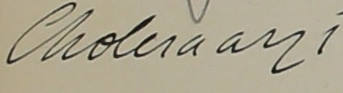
Choleraarzt
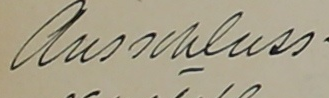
Ausschluss
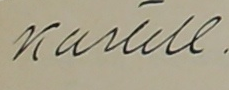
kartell
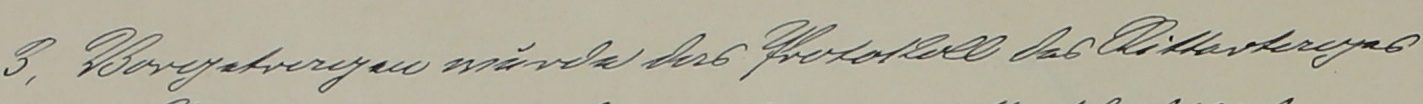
3. Vorgetragen wurde das Protokoll des Rittertages
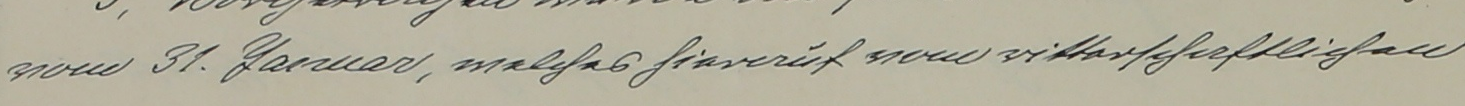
vom 31. Januar, welches hierauf vom ritterschaftlichen
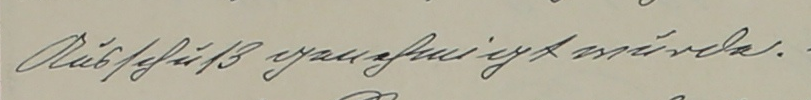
Ausschuß genehmigt wurde.
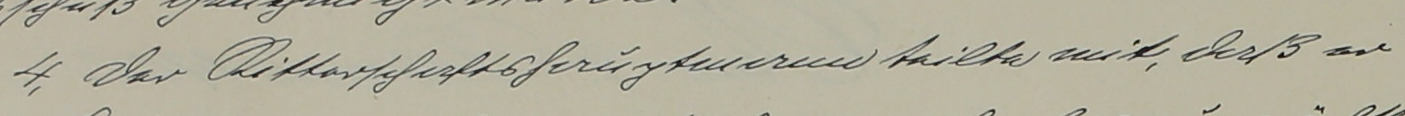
4. Der Ritterschaftshauptmann teilte mit, daß er
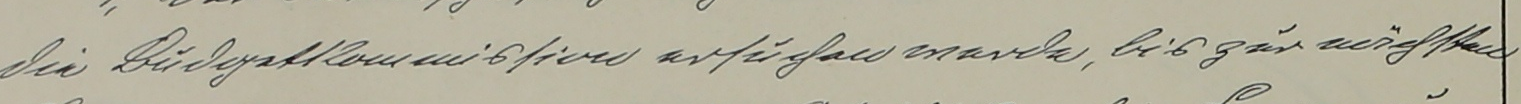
die Budgetkommission ersuchen werde, bis zur nächsten
